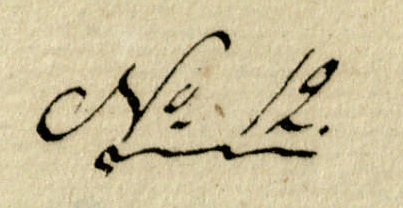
No 12.
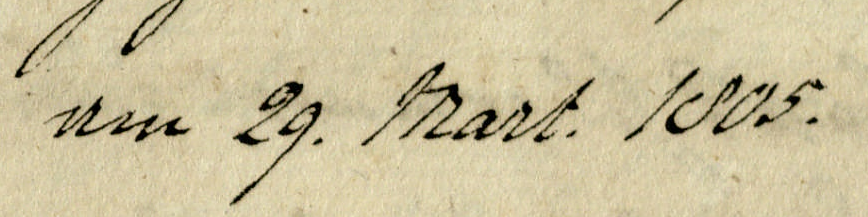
am 29. Mart. 1805.
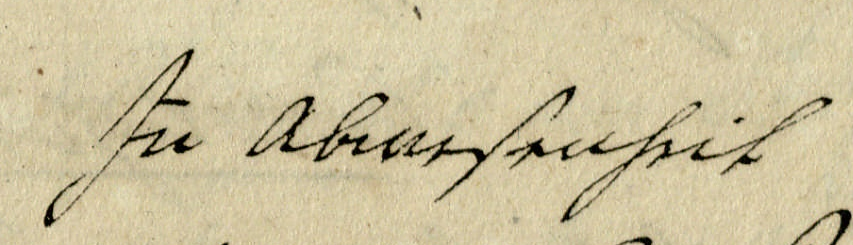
In Abwesenheit
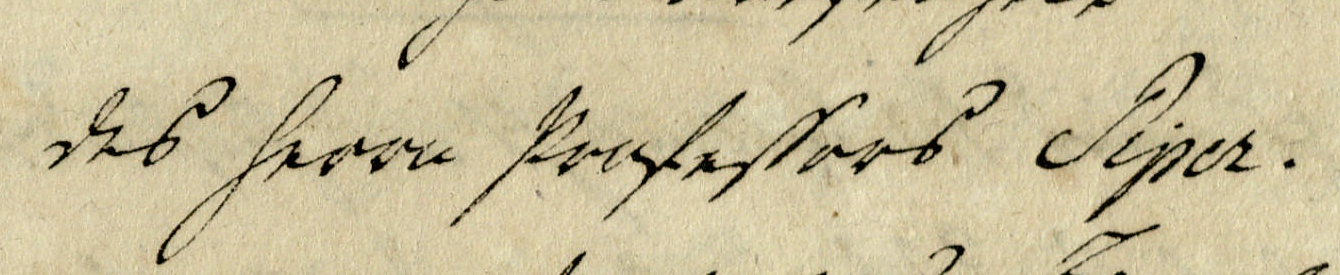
des Herrn Professors Piper.
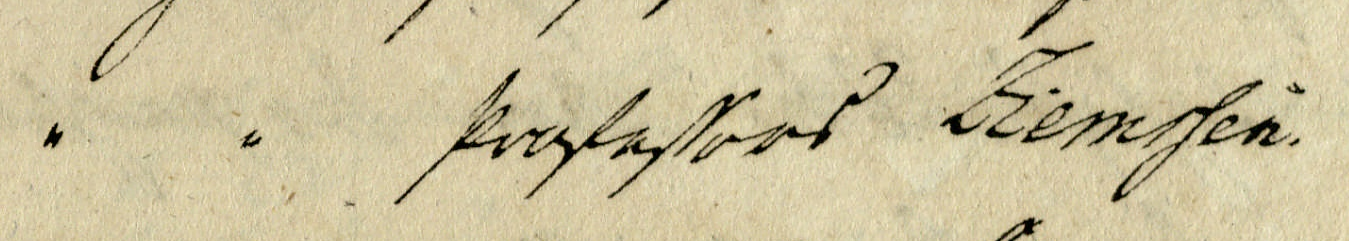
Professors Ziemssen.
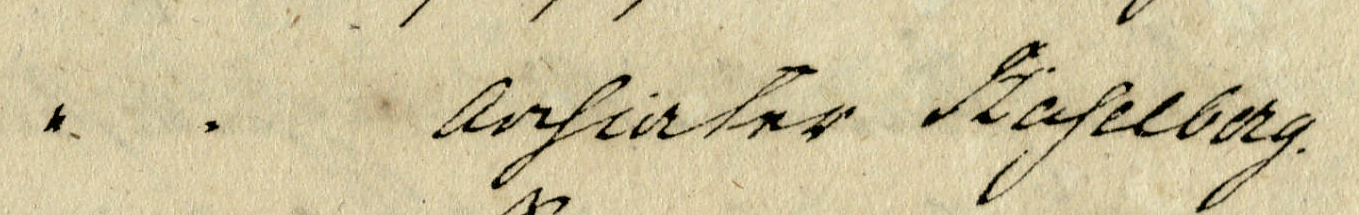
Archiater Haselberg.
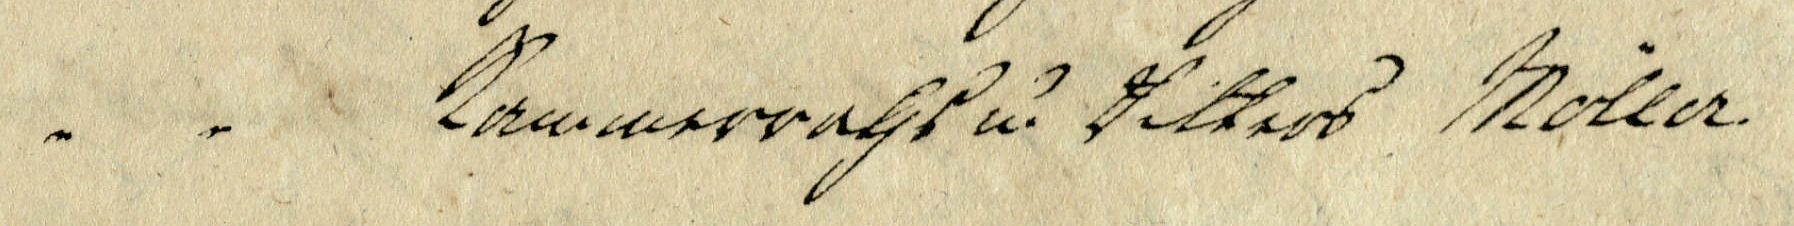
Kammerraths zu Ritters Möller.
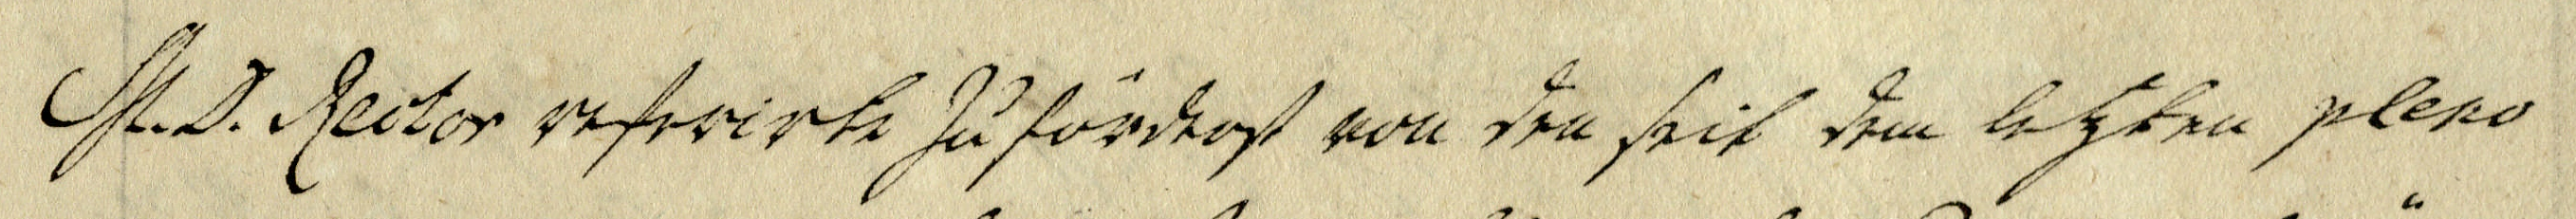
M. D. Rector referirte zuförderst von den seit dem letzten pleno
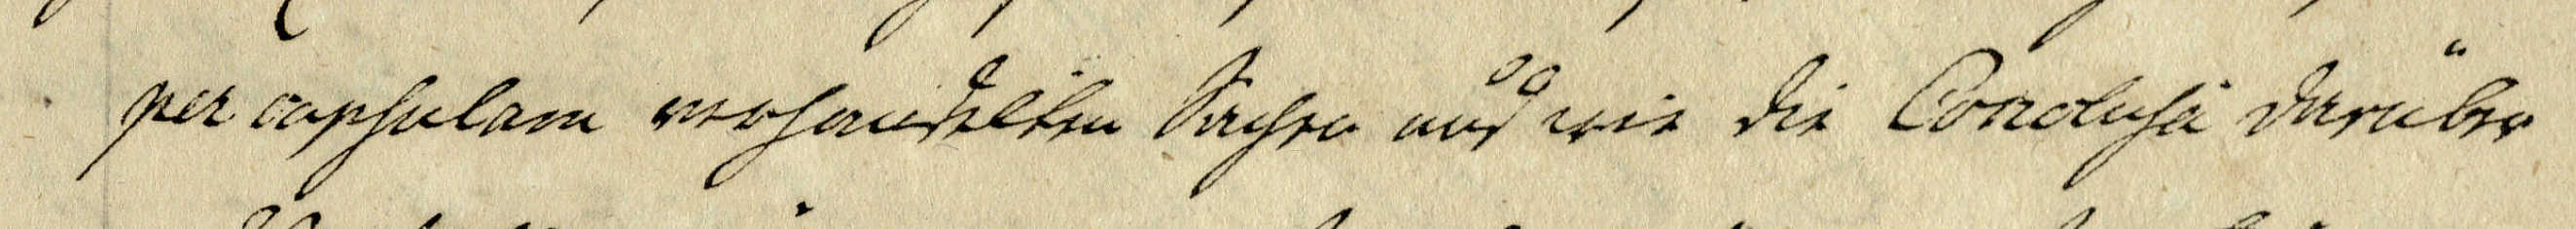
per capsulam verhandelten Sachen und wie die Conclusa darüber
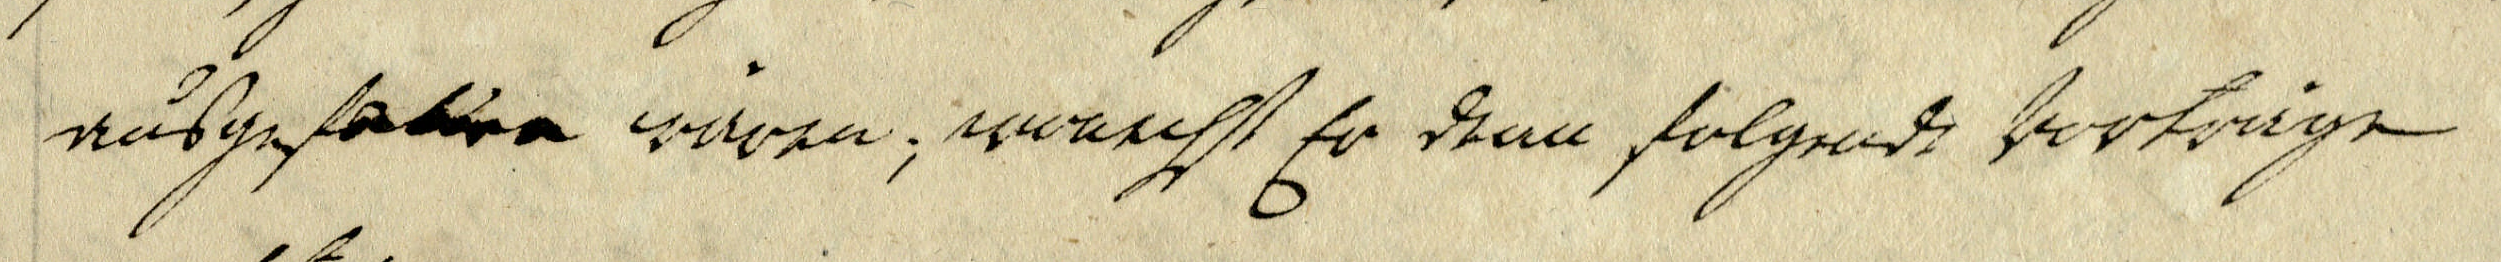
ausgefallen wären, wonechst Er denn folgende Vorträge
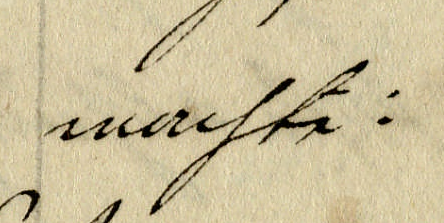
machte:
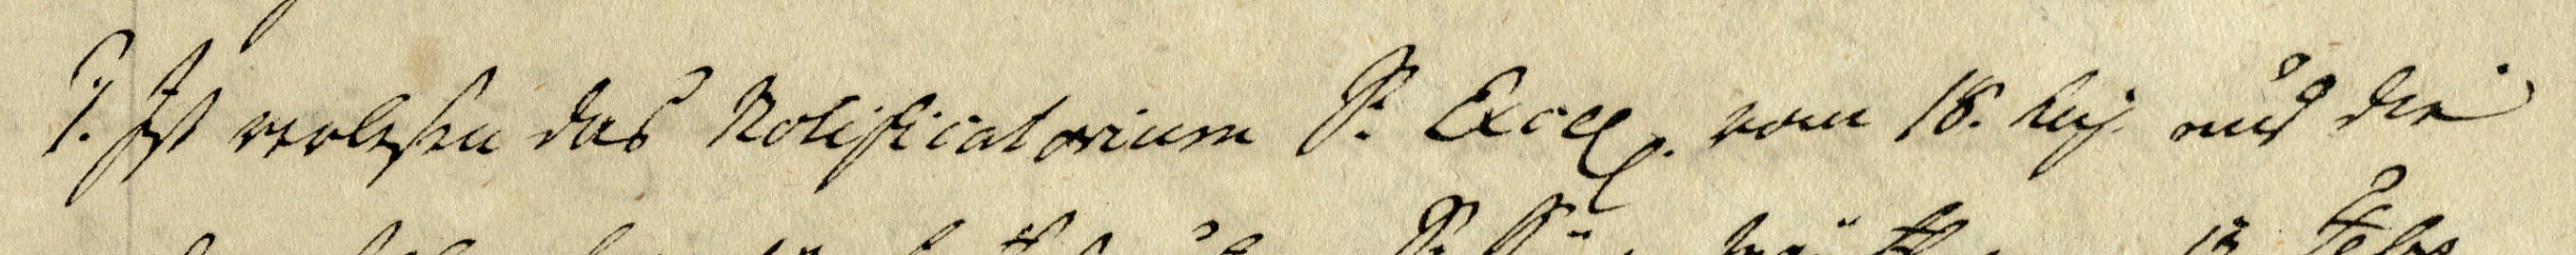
1. Ist verlesen das Notificatorium Sr. Excell. vom 18. huj und die
